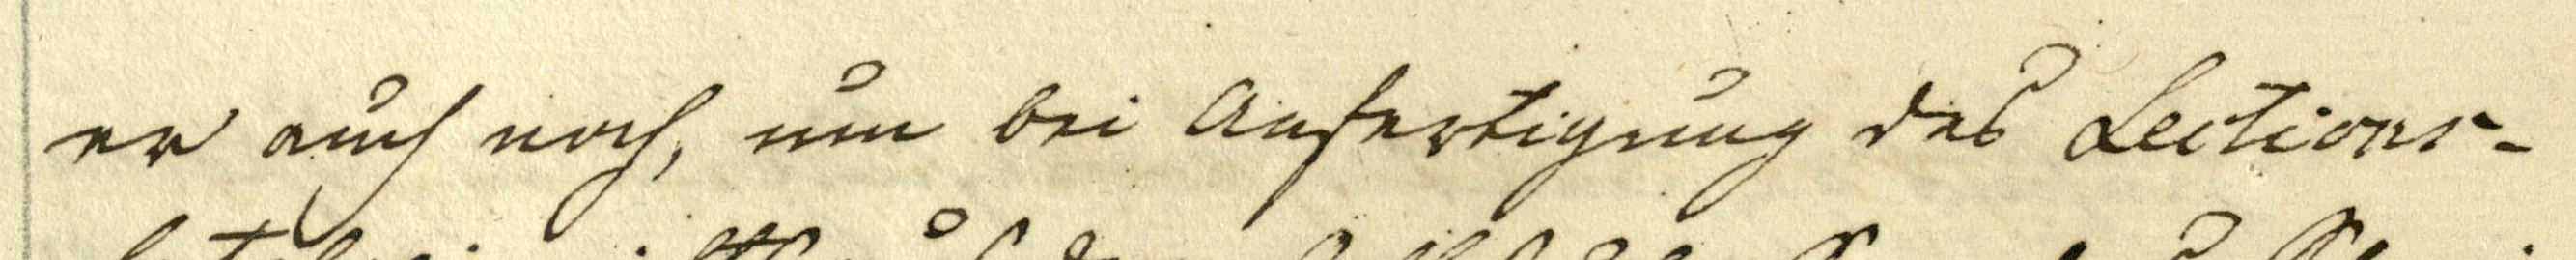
er auch noch, um bei Anfertigung des Lections¬
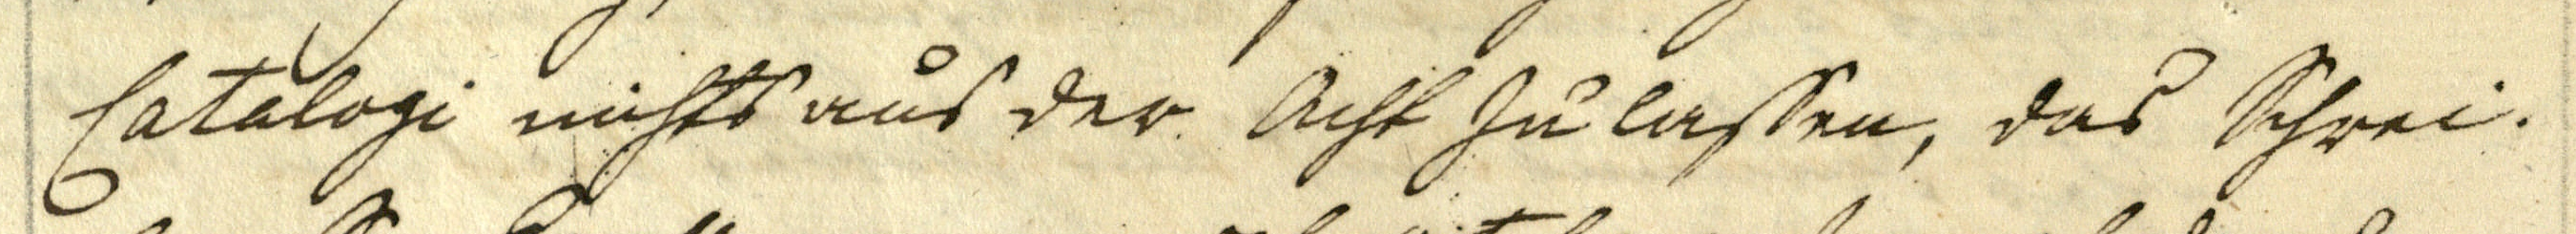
Catalogi nichts aus der Acht zu lassen, das Schrei¬
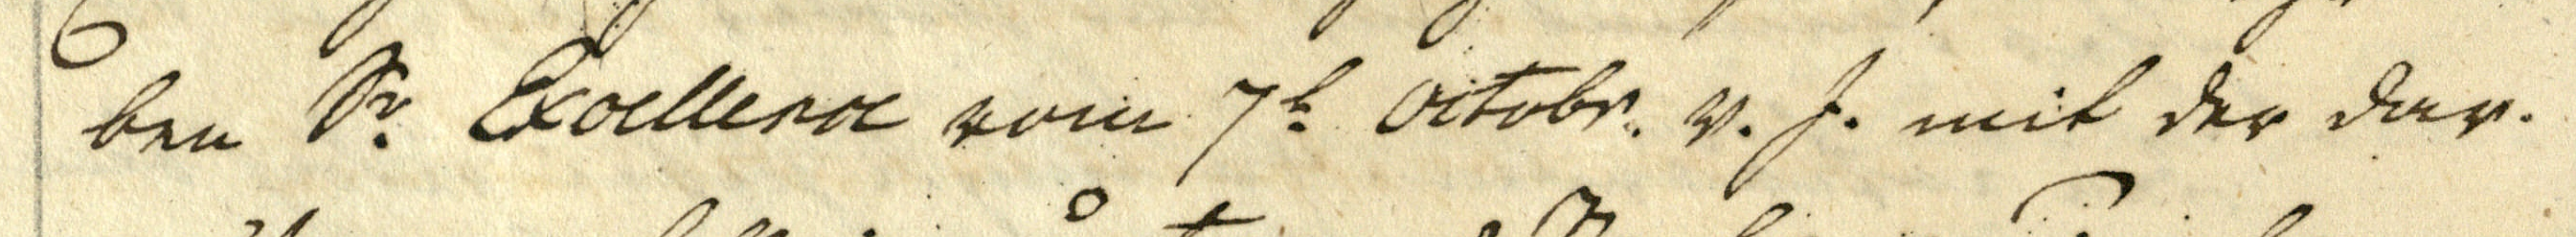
ben Sr Excellence vom 7 t Octobr. v. J. mit der dar
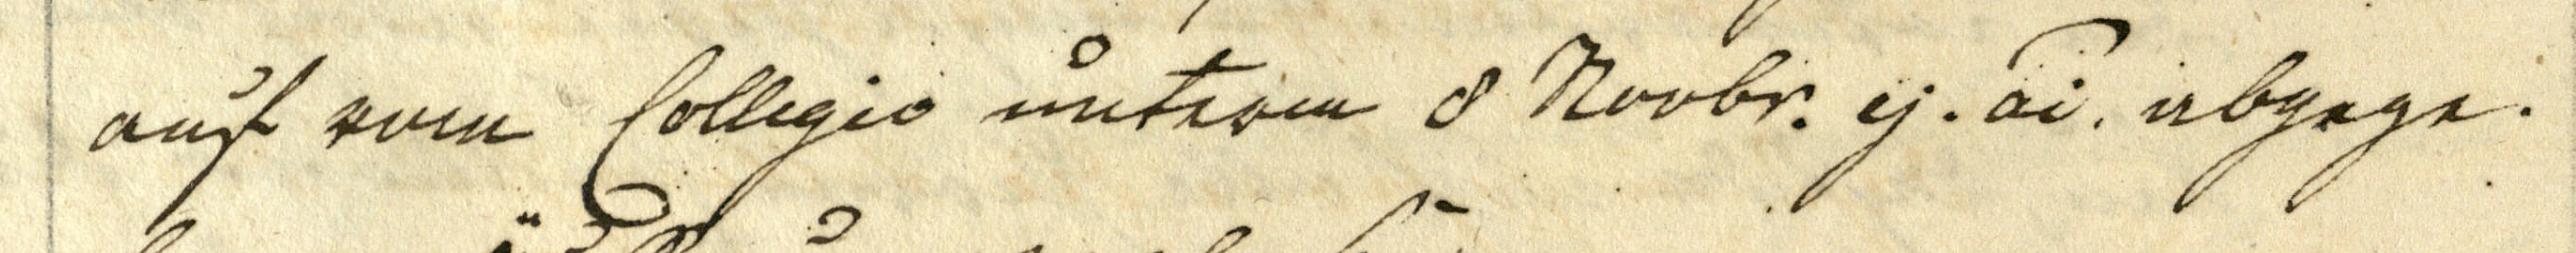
auf vom Collegio unterm 8 Novbr. ej. ai, abgege¬
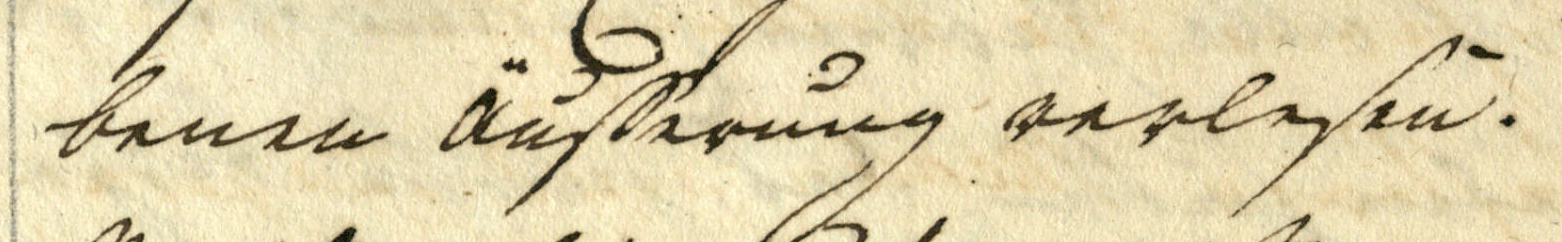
benen Äusserung verlesen.
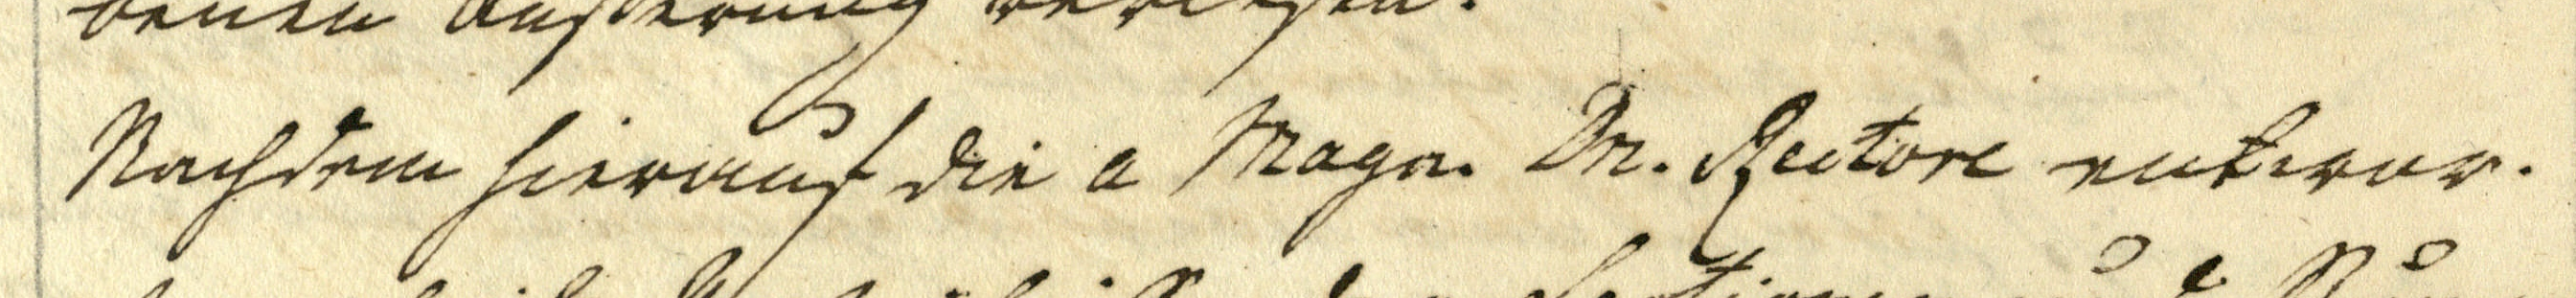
Nachdem hierauf die a Magn. Dn. Rectore entwor¬
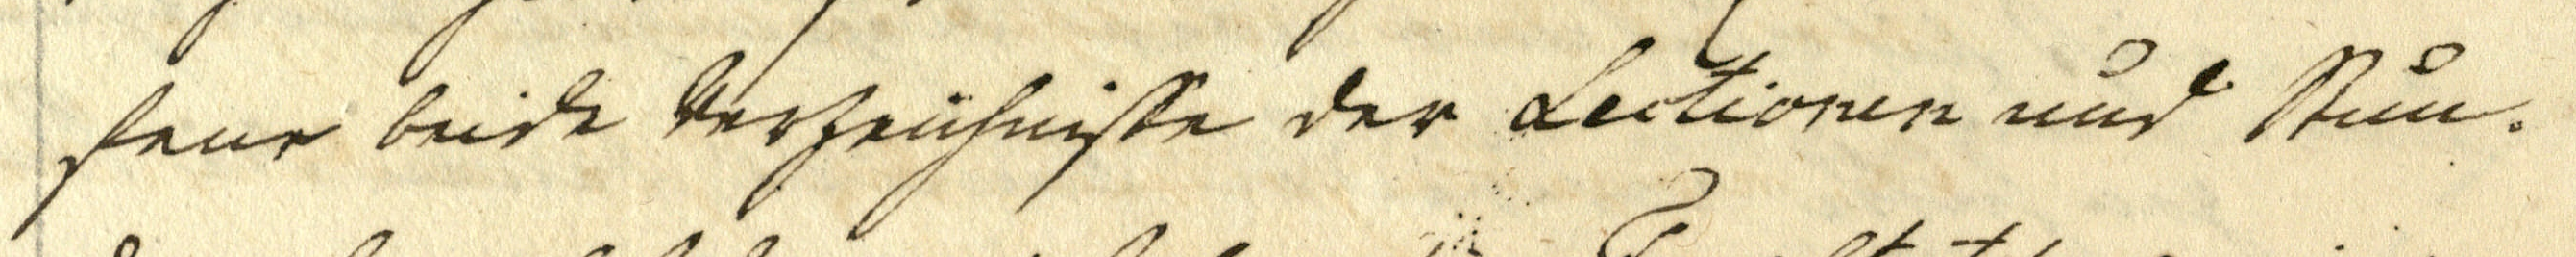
fene beide Verzeichnisse der Lectionen und Stun¬
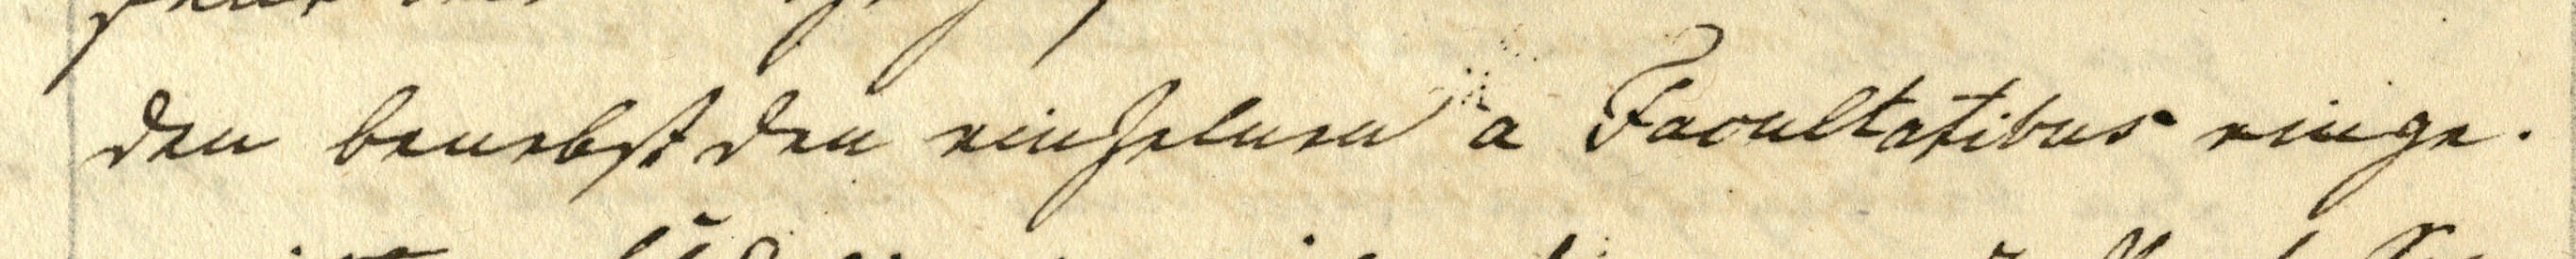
den benebst den einzelnen Facultatibus einge¬
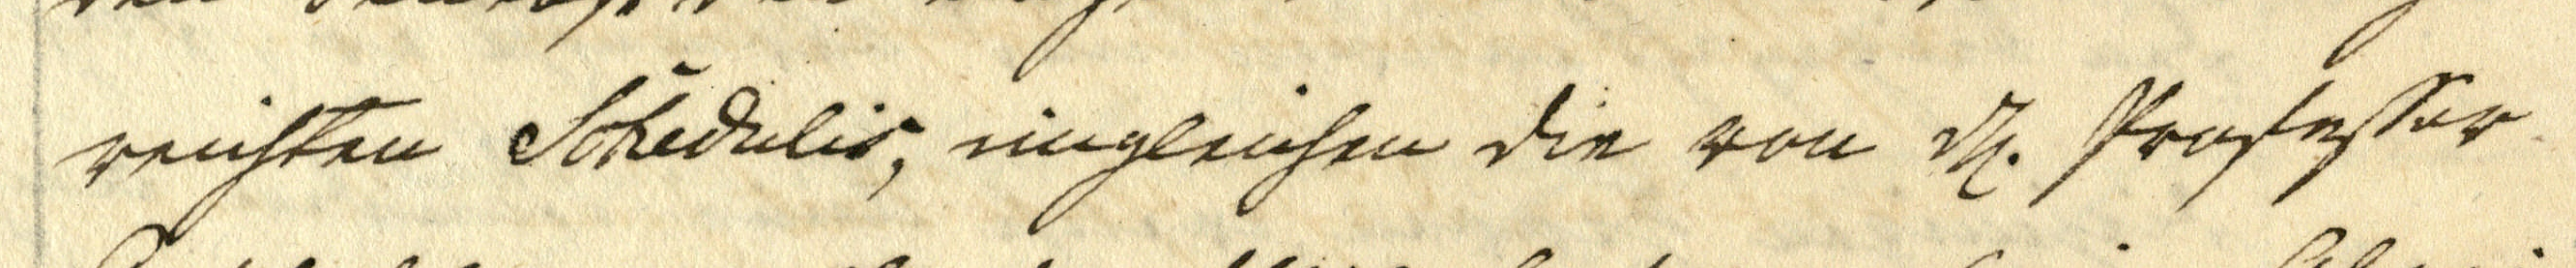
reichten Schedulis, imgleichen die von dh. Professor
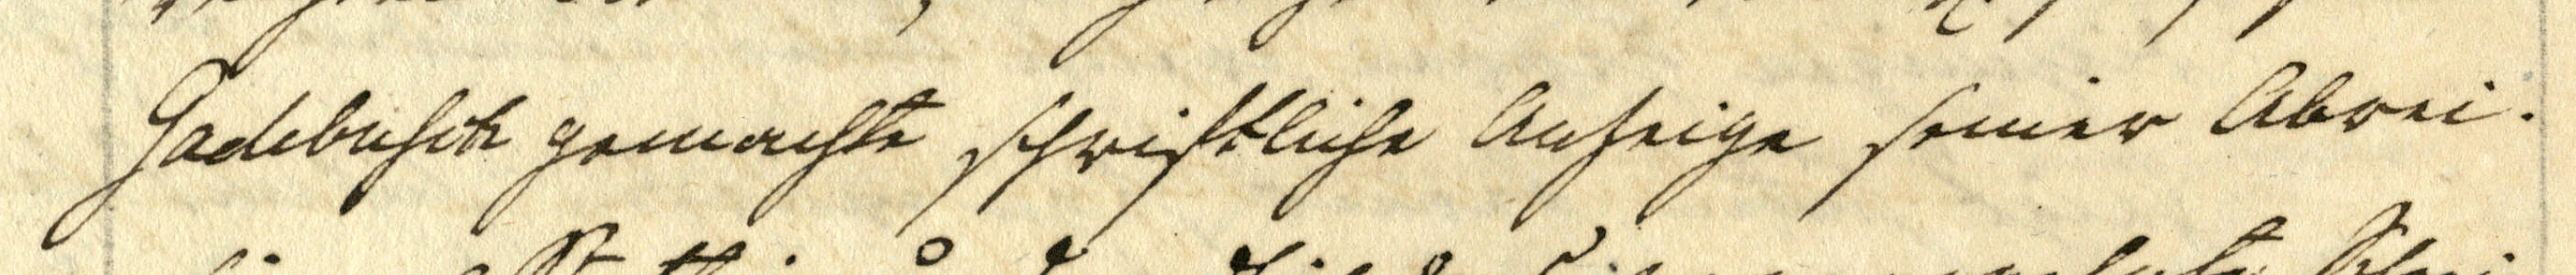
Gadebusch gemachte schriftliche Anzeige seiner Abrei¬
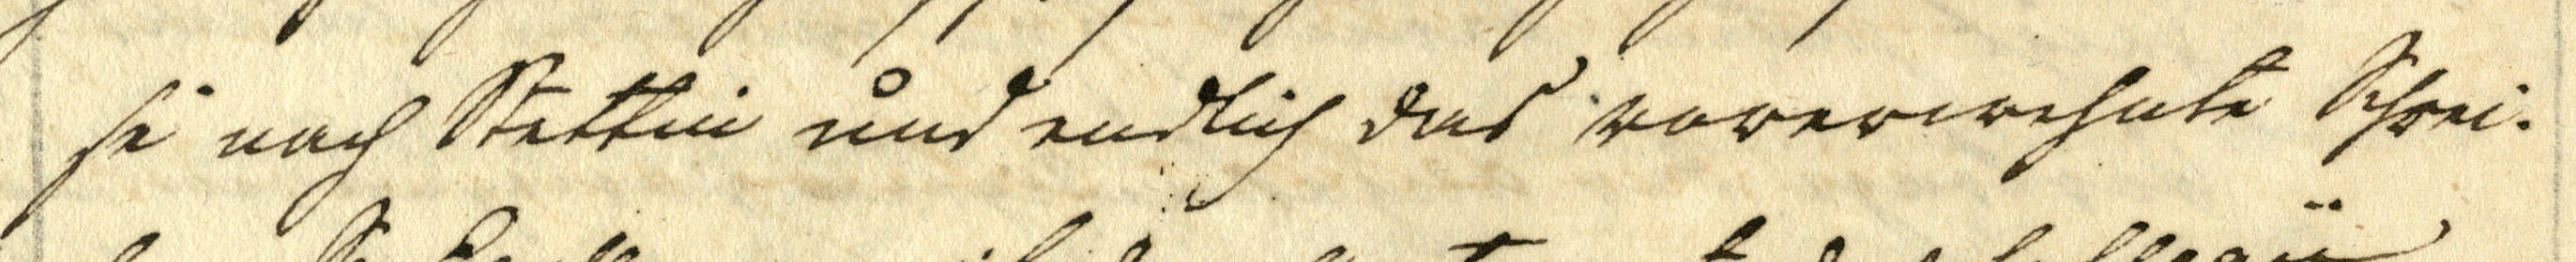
se nach Stettin und endlich das vorerwehnte Schrei¬
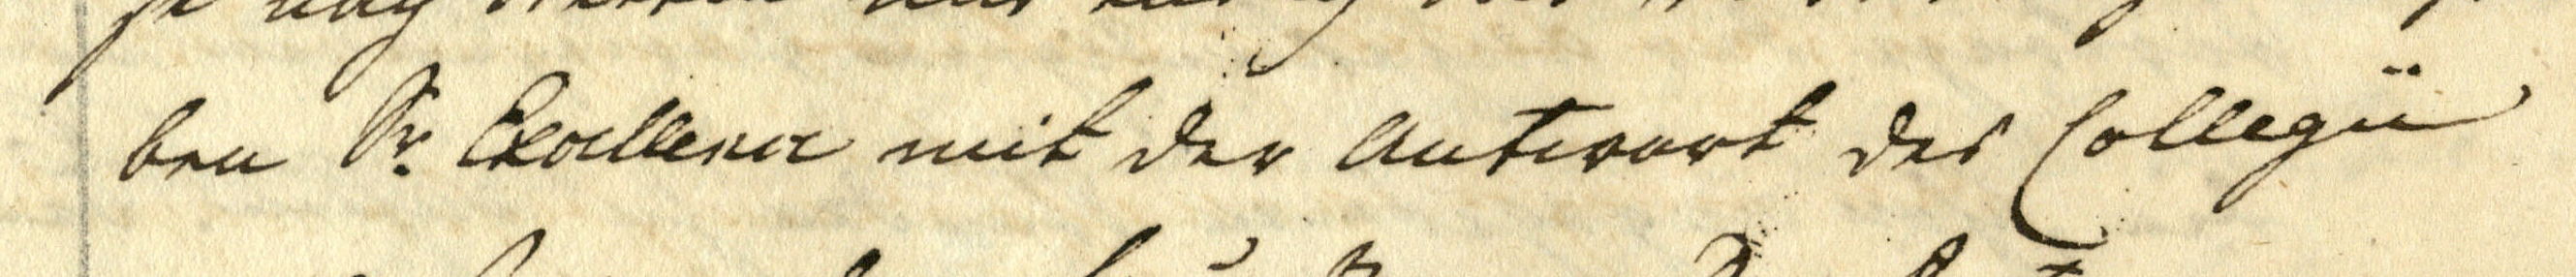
ben Sr Excellence mit der Antwort des Collegii
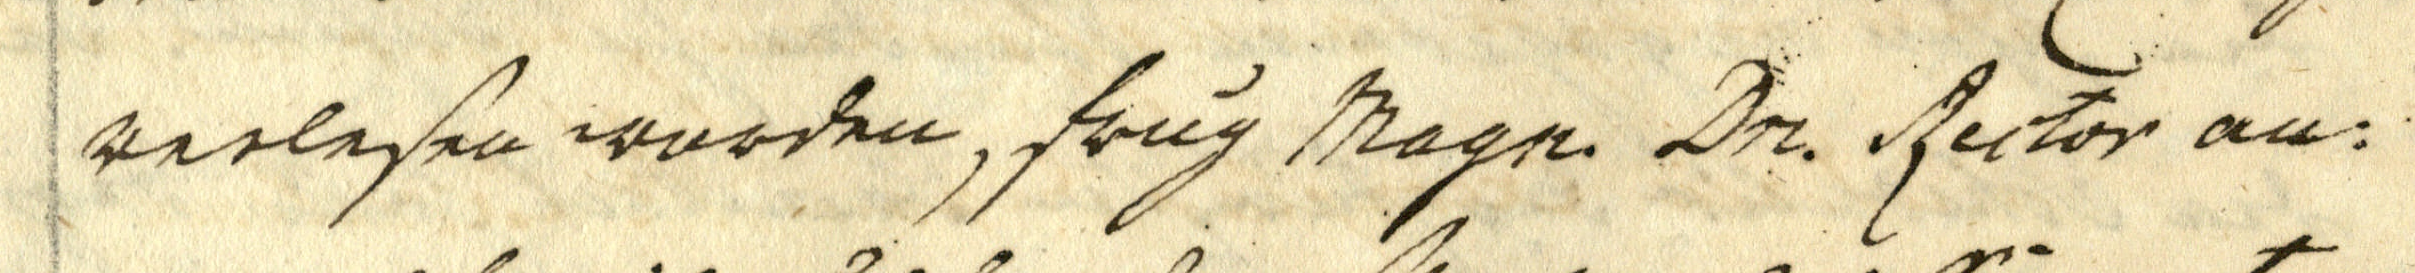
verlesen worden, frug Magn. Dn. Rector an:
